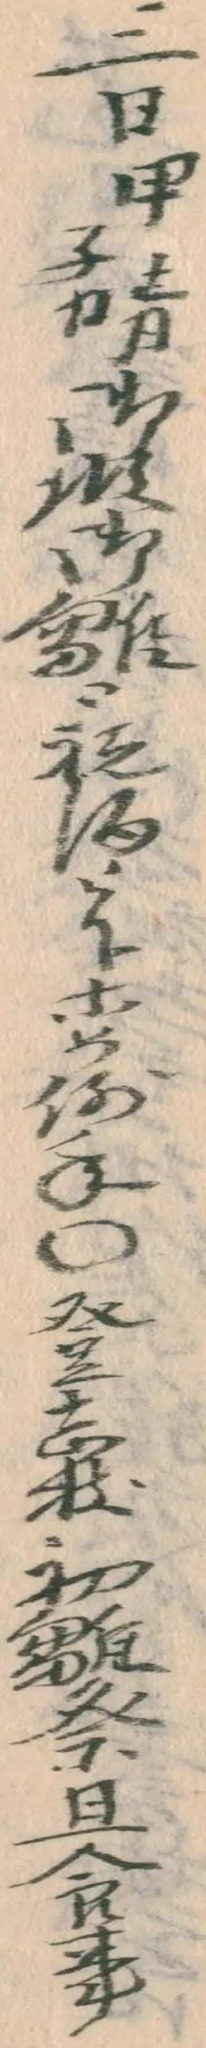三日甲子晴御御殿御雛御祝酒被下等如例年○登志枝初雛祭且食事
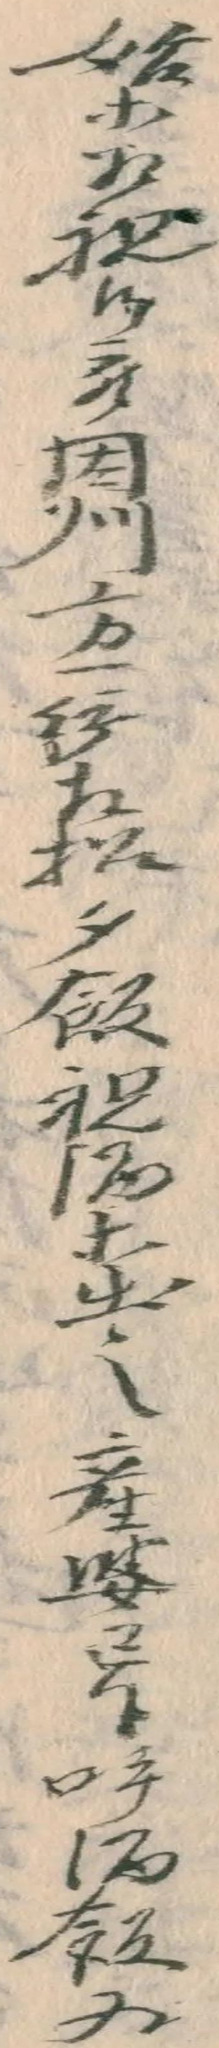始等相祝候ニ付因州方一統相招夕飯祝酒等出之産婆已下呼酒飯為
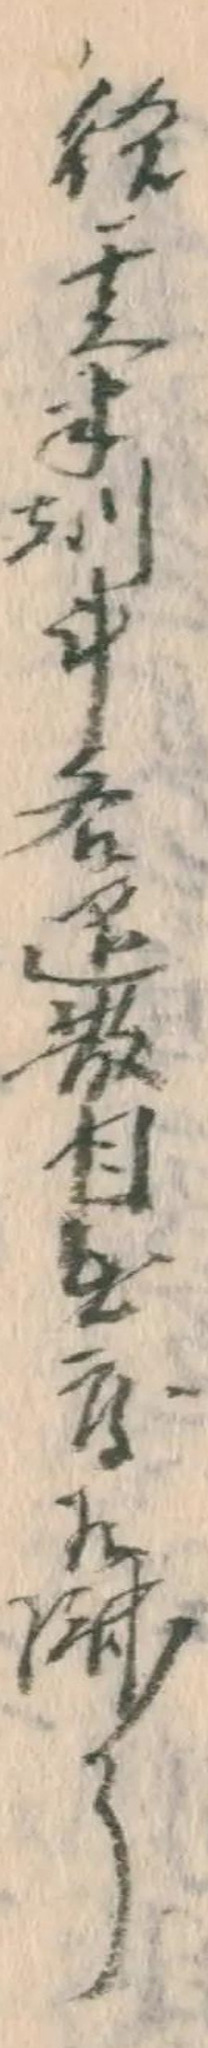給亥半刻斗各退散目出度相済了
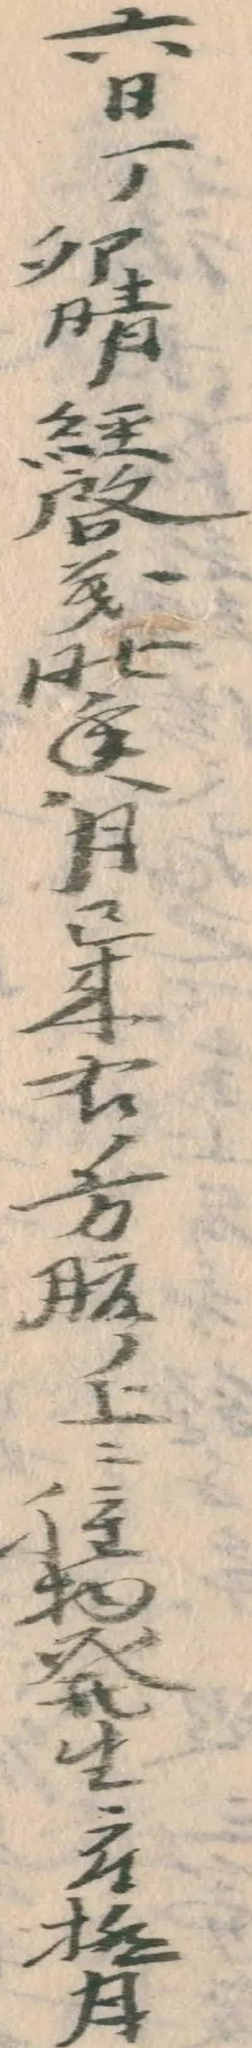六日丁卯晴経啓義昨年八月已来右ノ方腋ノ上ニ腫物発生ニ付月
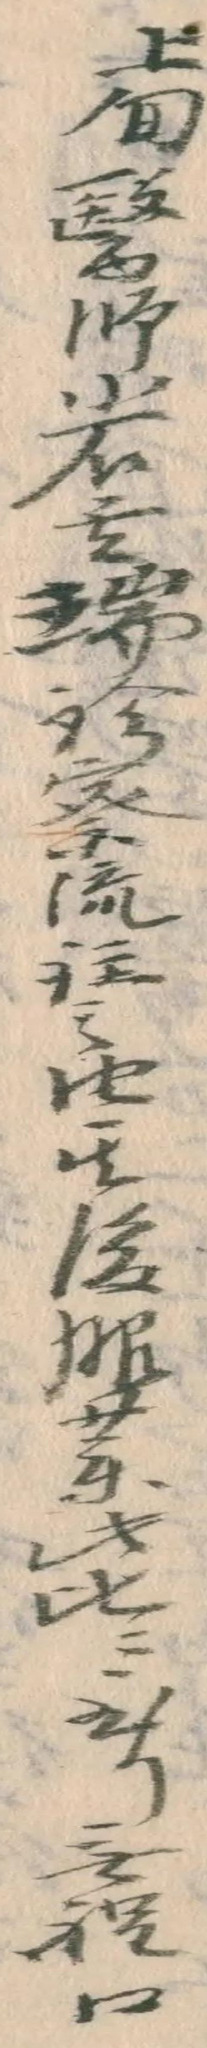上旬医師小石玄瑞診察流起之由其後服薬此比に至り無程口
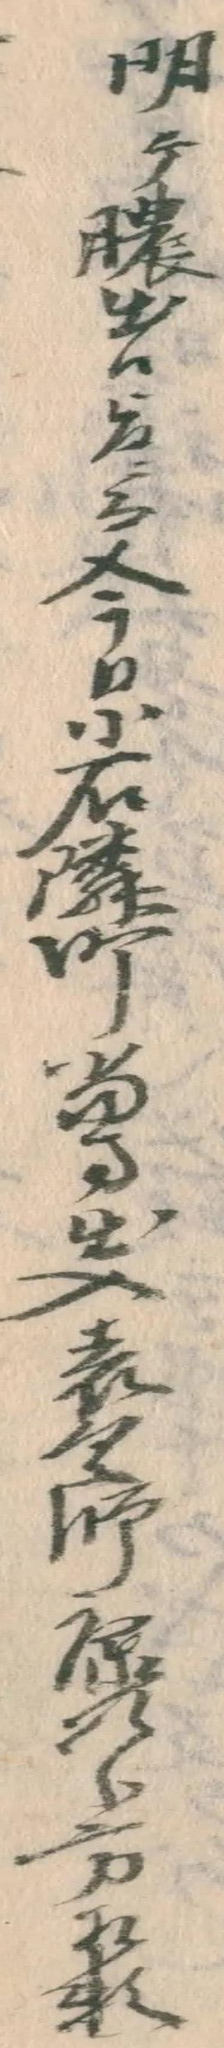明ケ膿出候旨二而今日小石隣町當方出入表具師虎次郎方相頼
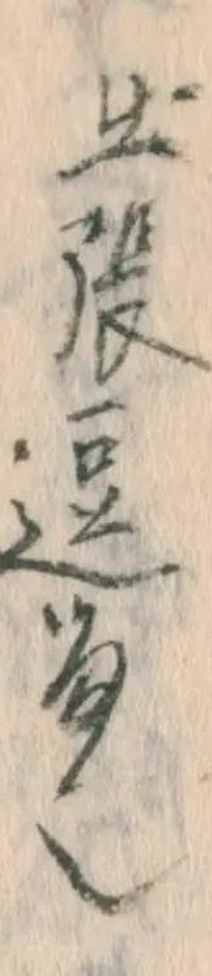出張逗留也
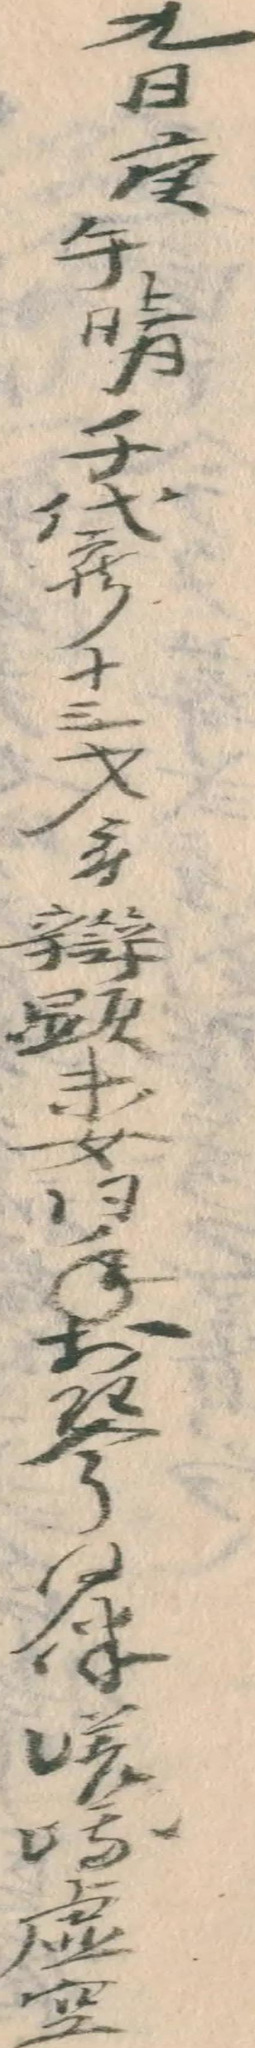九日庚午晴千代蔵十三才ニ付辨顕末女同年お琴同伴嵯峨虚空
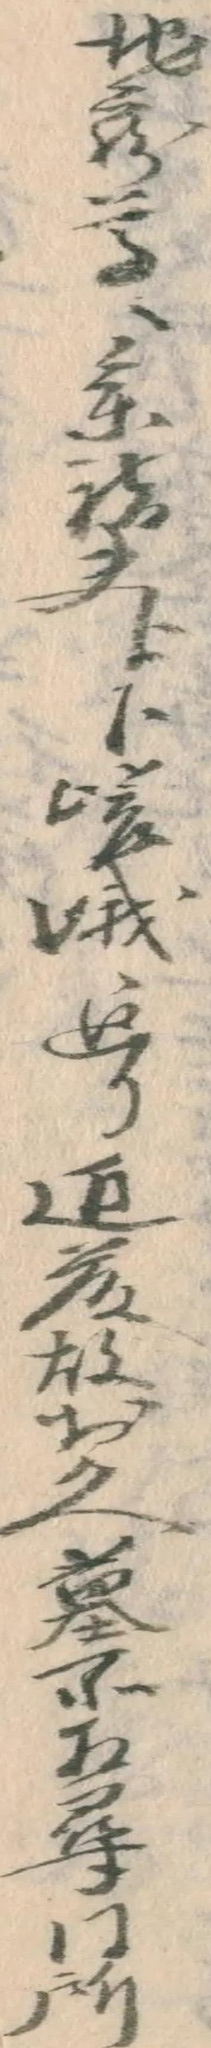地蔵尊へ参詣夫ゟ下嵯峨ヘ廻り近藤故お久墓所相尋同所
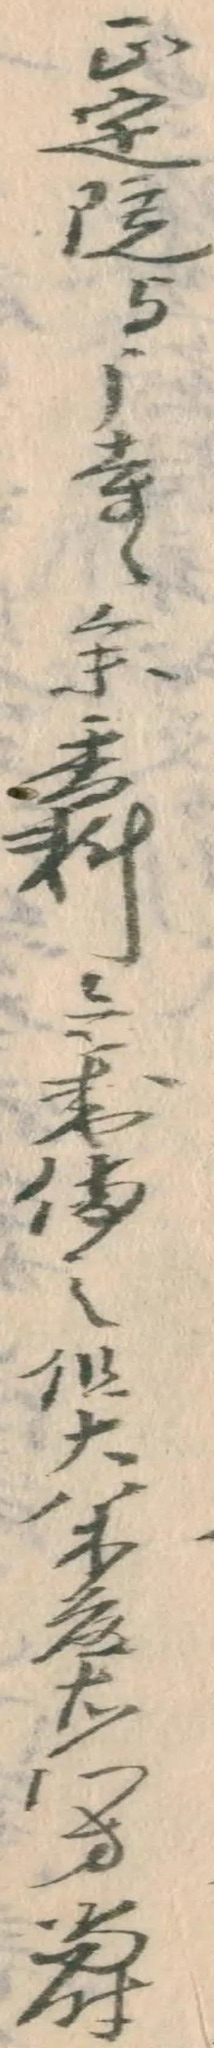正定院と申寺へ参香料壱束備之但大八木藤右衛門方當時
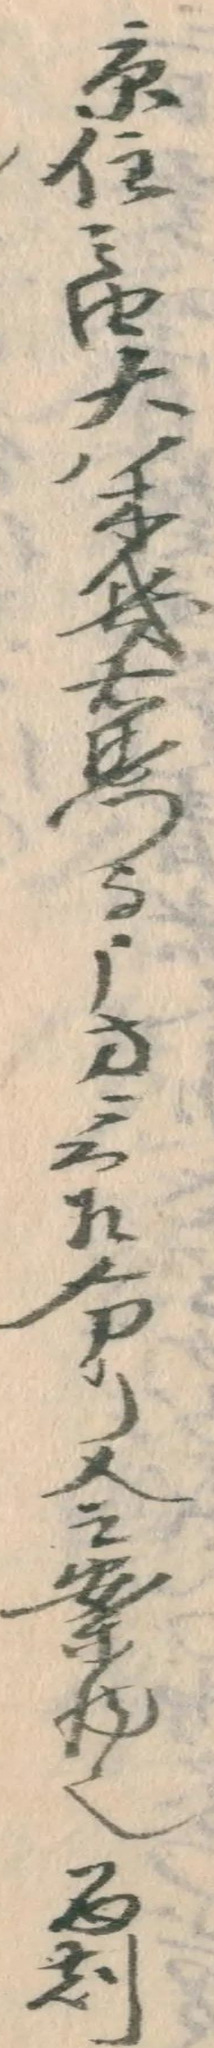京住之由大八木幾右衛門と申方二而相分り令又之也酉刻
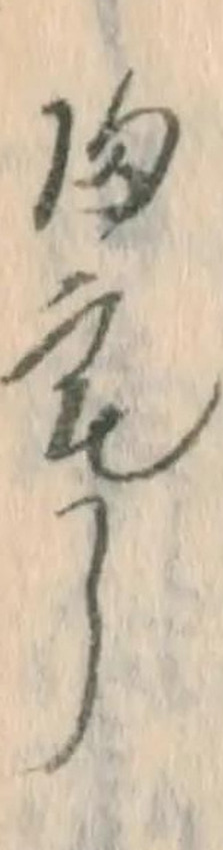帰宅了

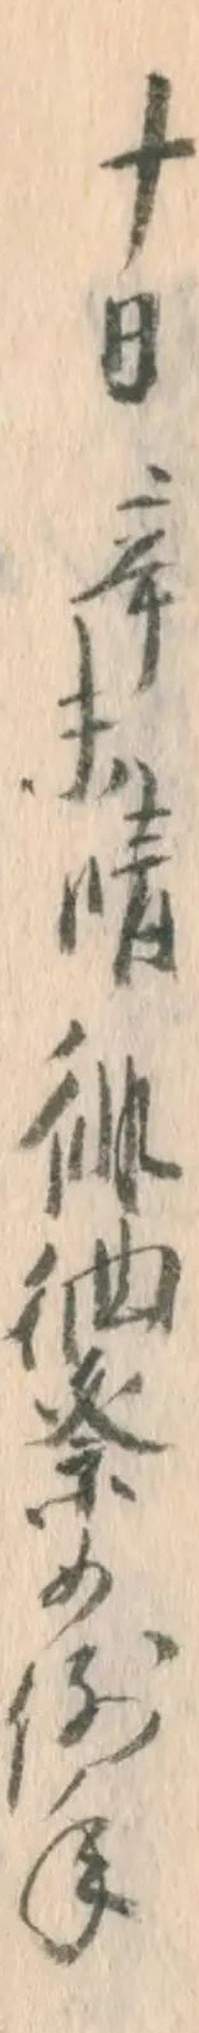十日辛未晴徘徊祭如例年
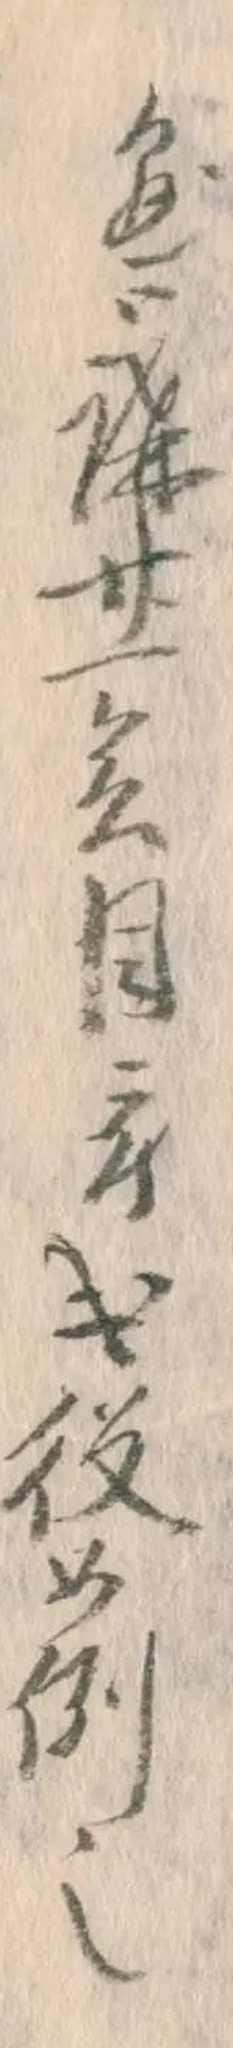懸御講廿一會目ニ付出役如例也
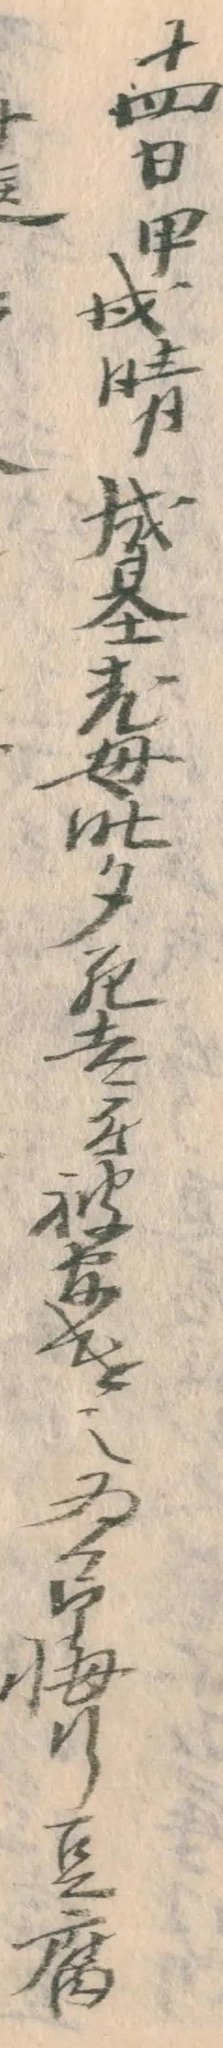十四日甲戌晴成基老母昨夕死去ニ付被官遣也為弔悔行豆腐
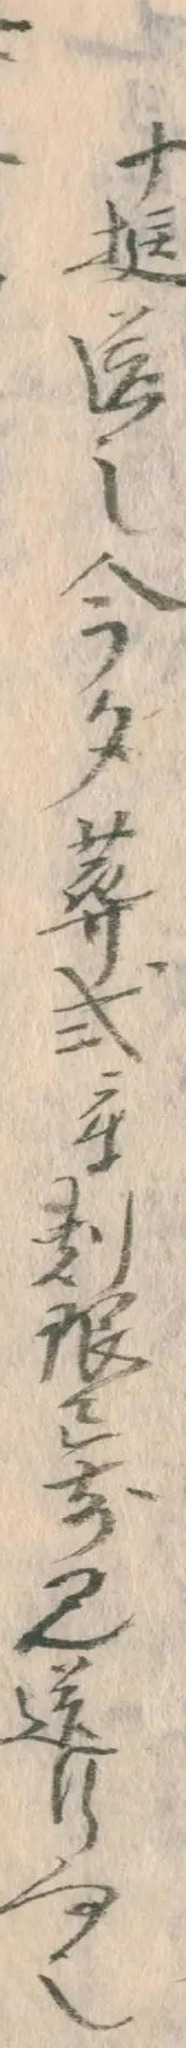十挺送之今夕葬式ニ付刻限已前見送行向也
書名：賀茂社記録. 第70冊
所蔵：国立国会図書館 National Diet Library, JAPAN
